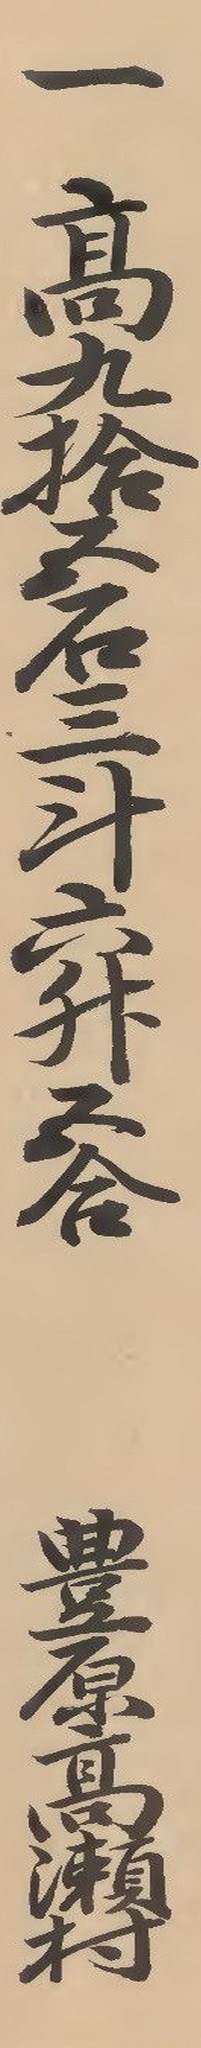一高九拾五石三斗六升五合豊原高瀬村
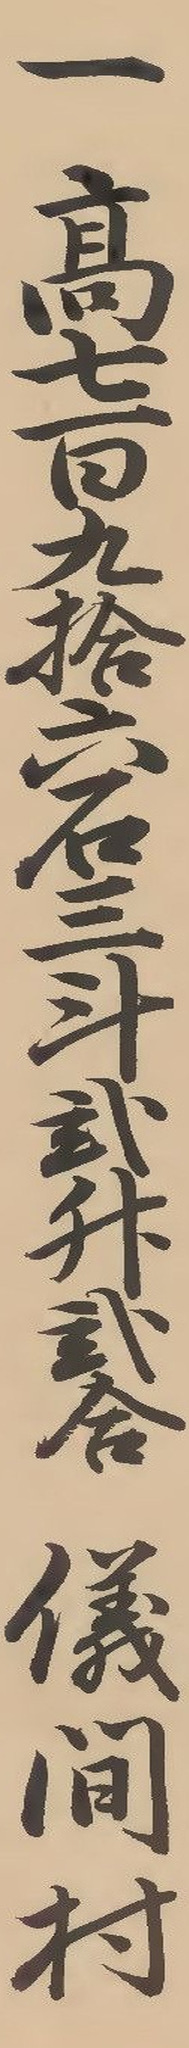一高七百九拾六石三斗弐升弐合儀間村
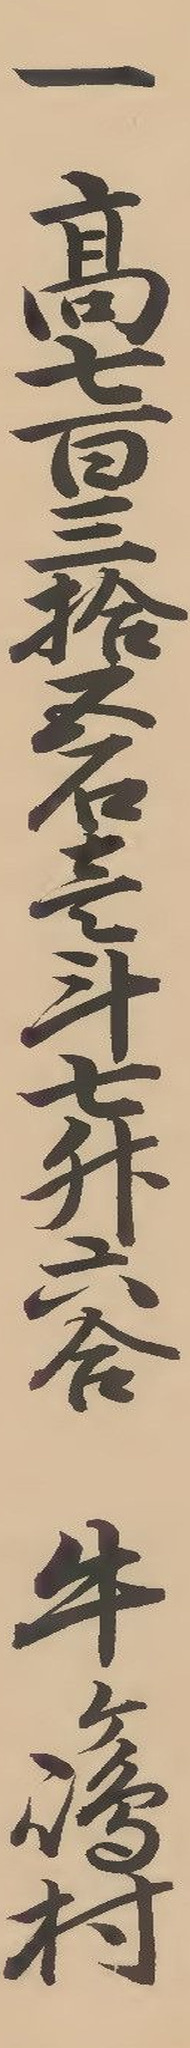一高七百三拾五石壱斗七升六合牛ヶ島村

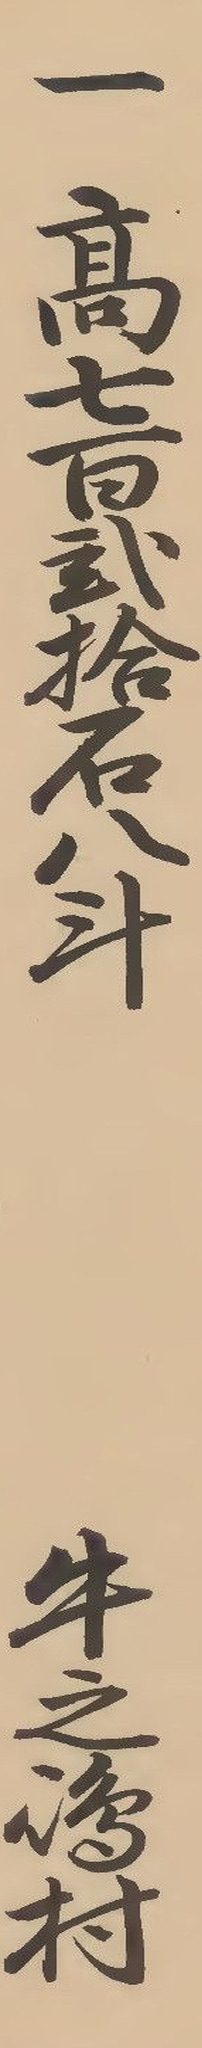一高七百弐拾石八斗牛之島村
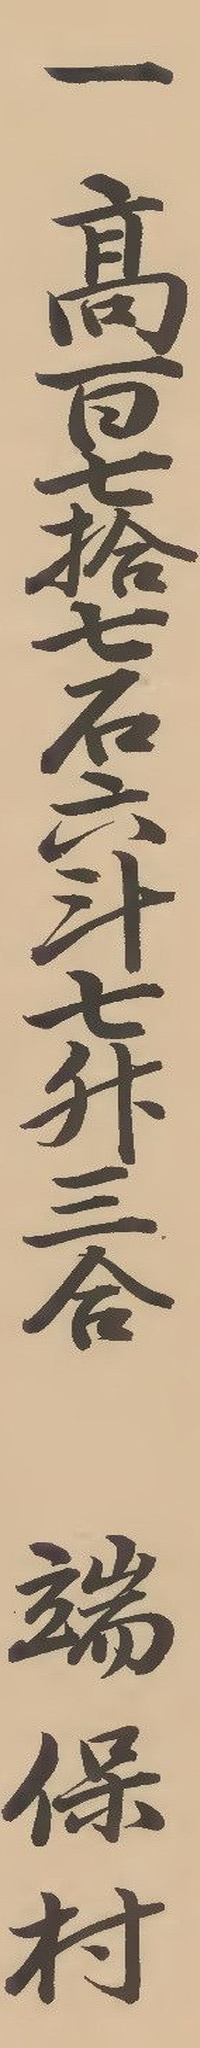一高百七拾七石六斗七升三合端保村
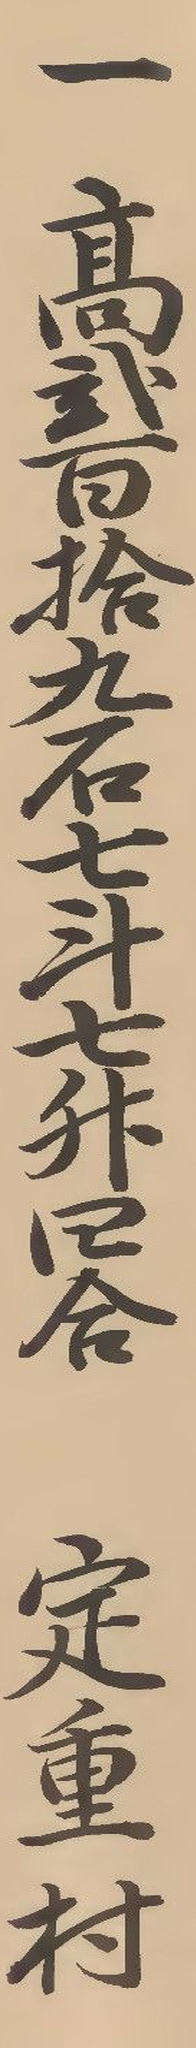一高弐百拾九石七斗七升四合定重村
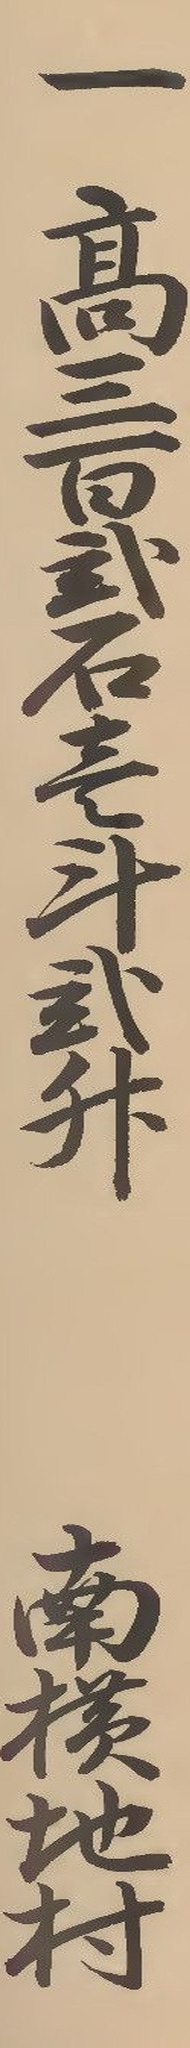一高三百弐石壱斗弐升南横地村
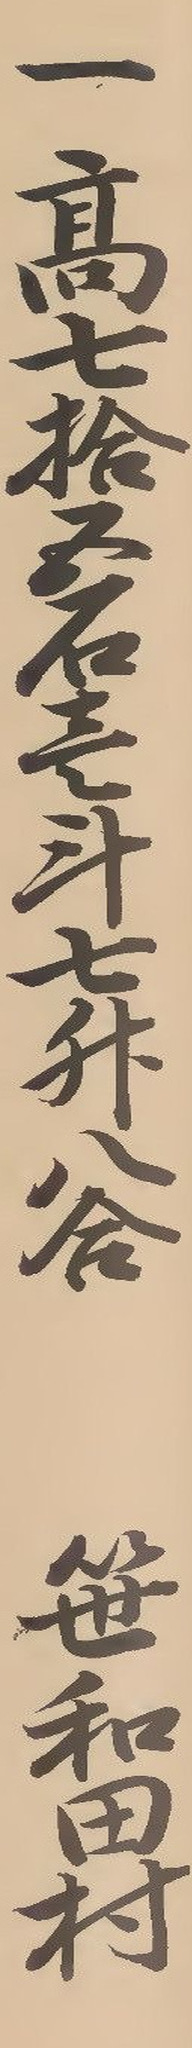一高七拾五石壱斗七升八合笹和田村
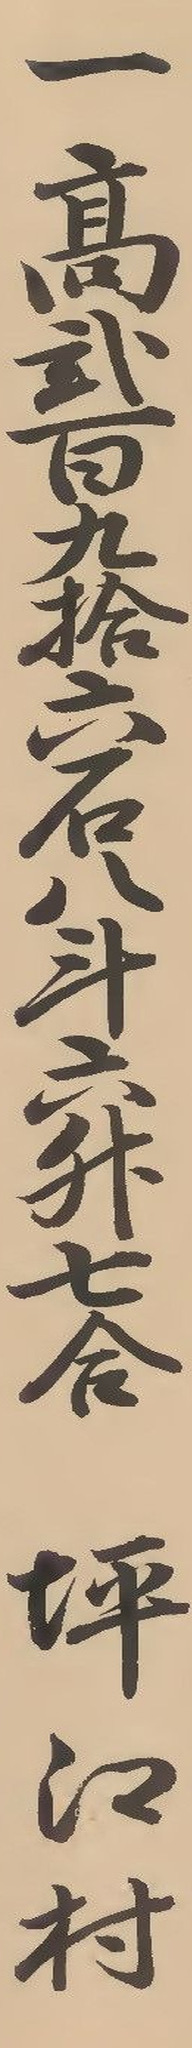一高弐百九拾六石八斗六升七合坪江村
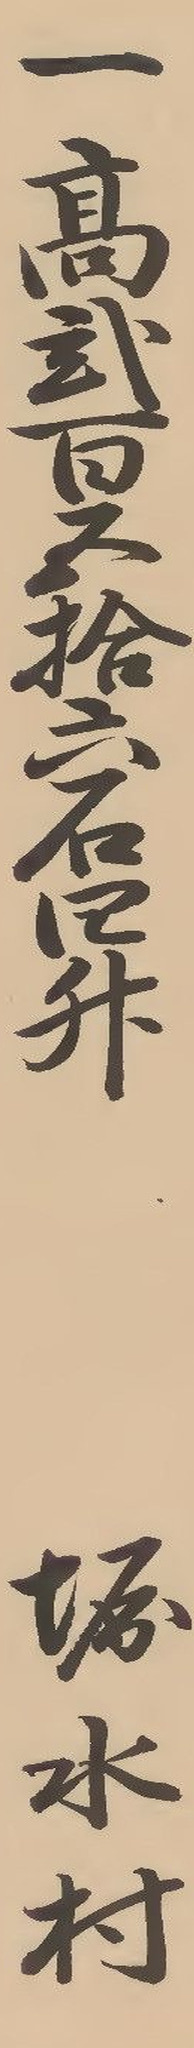一高弐百五拾六石四升堀水村
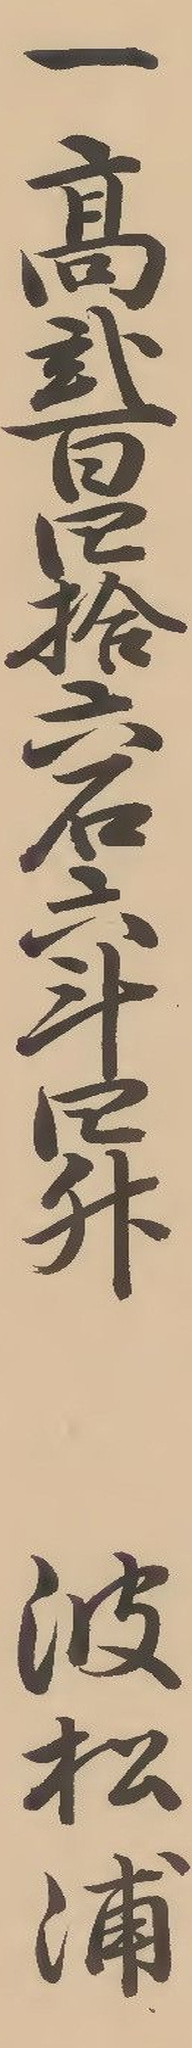一高弐百四拾六石六斗四升波松浦

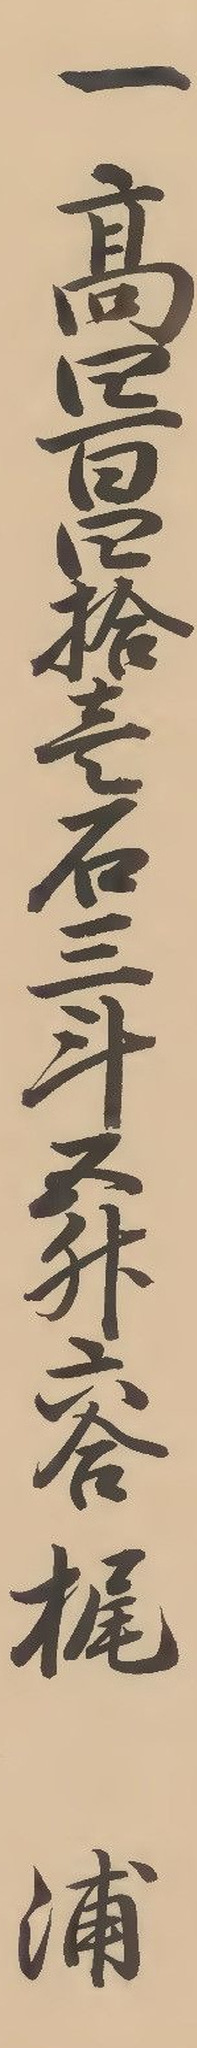一高四百四拾壱石三斗五升六合梶浦
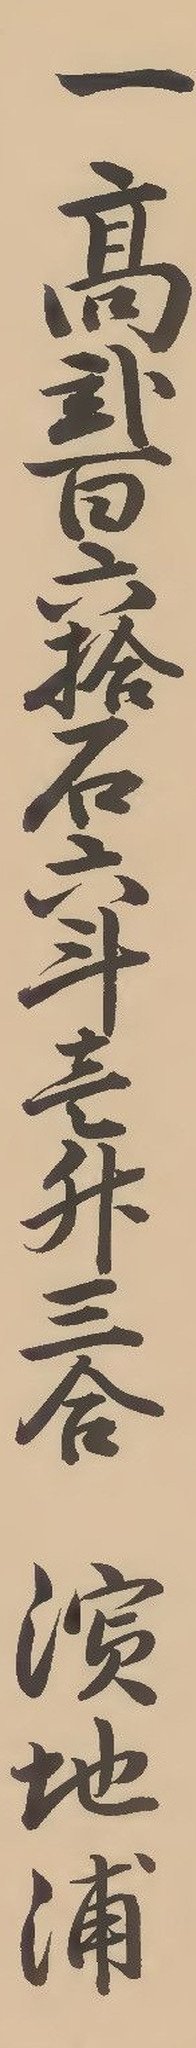一高弐百六拾石六斗壱升三合浜地浦
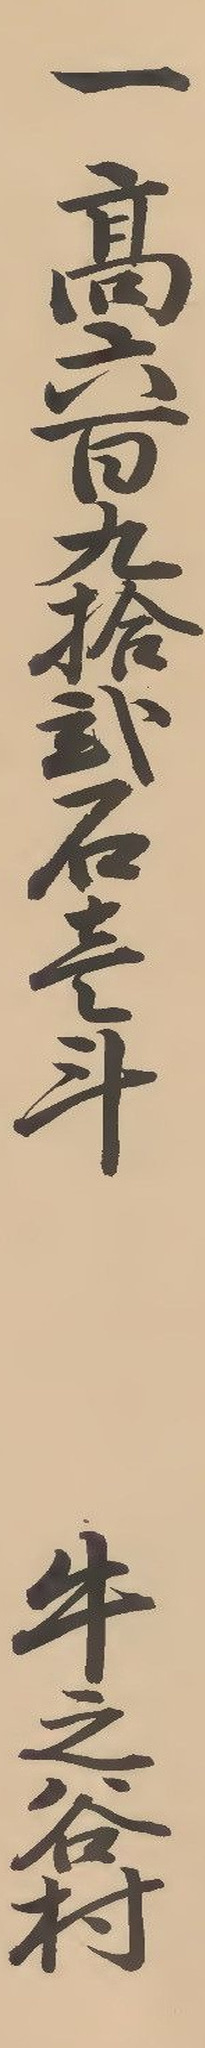一高六百九拾弐石壱斗牛之谷村
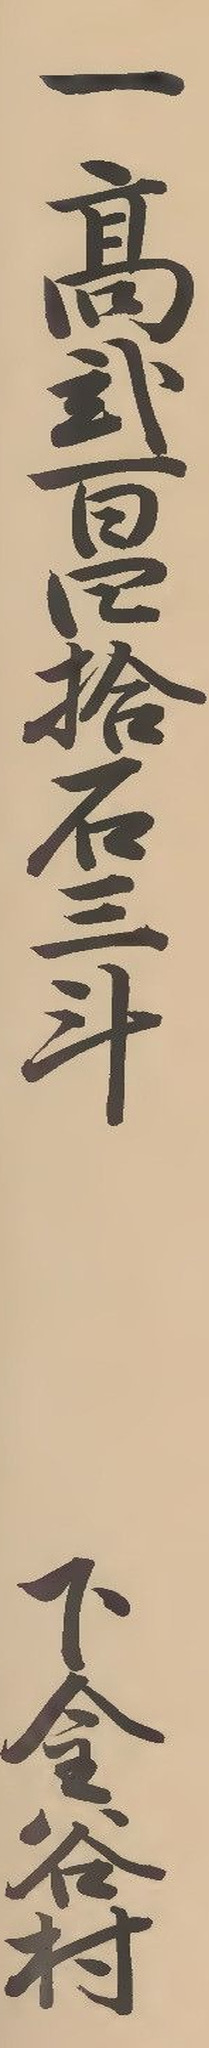一高弐百四拾石三斗下金谷村
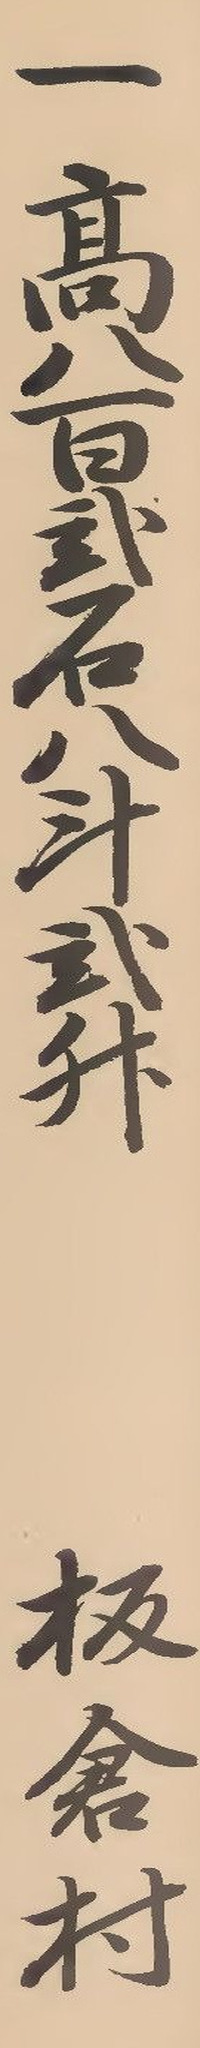一高八百弐石八斗弐升板倉村
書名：越前国郷帳
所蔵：国立公文書館 National Archives of Japan
